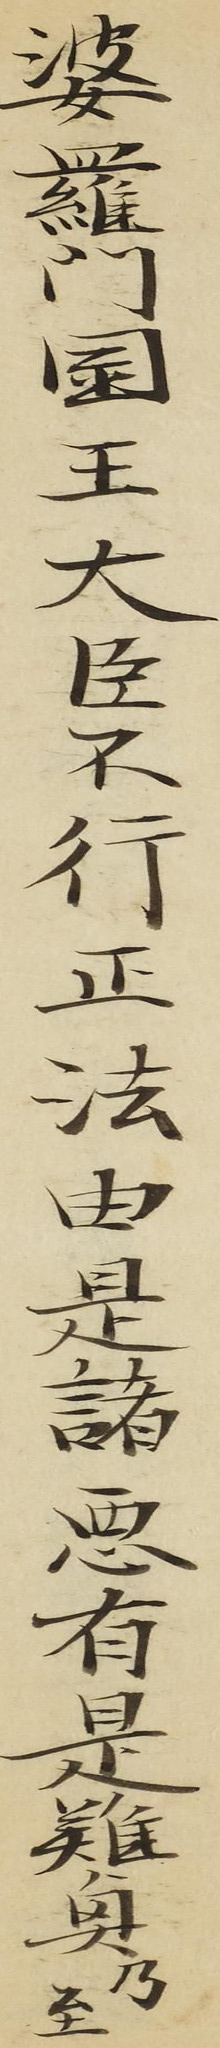婆羅門国王大臣不行正法由是諸悪有是難興乃至
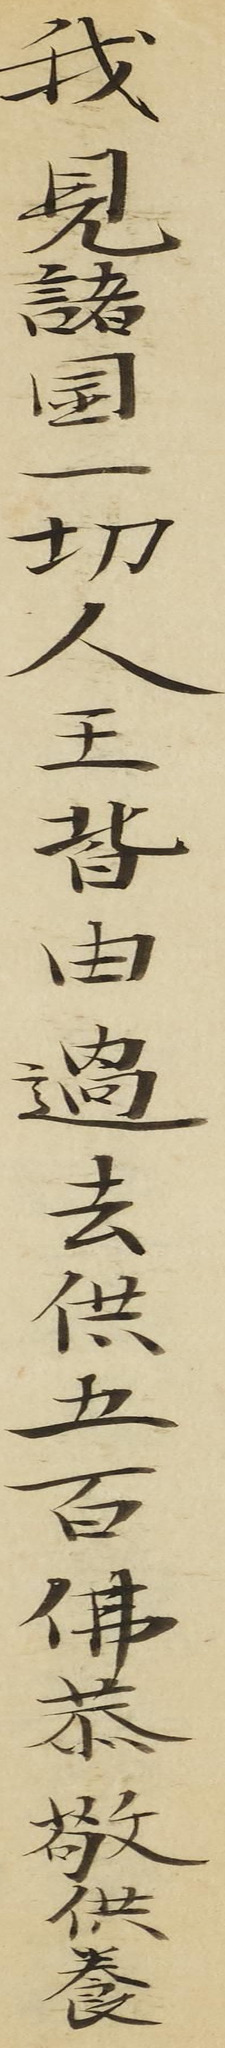我見諸国一切人王皆由過去供五百仏恭敬供養
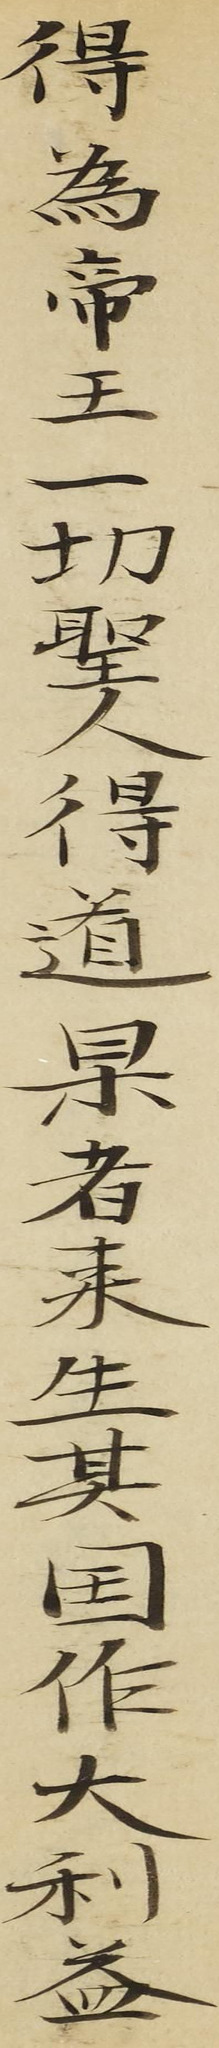得為帝王一切聖人得道果者来生其国作大利益
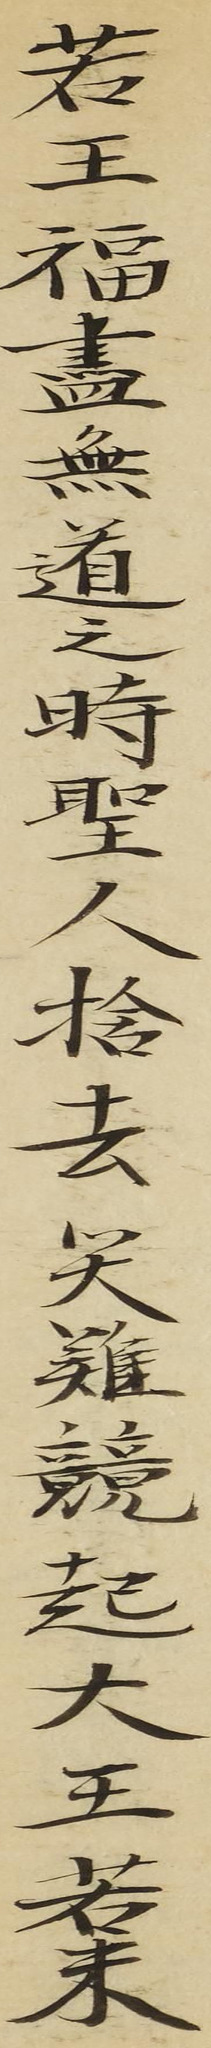若王福尽無道之時聖人捨去災難競起大王若未
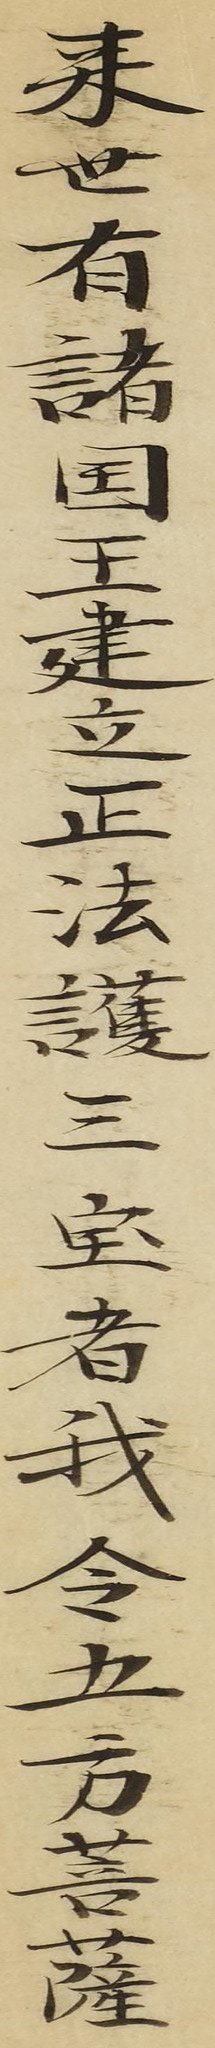来世有諸国王建立正法護三宝者我令五方菩薩
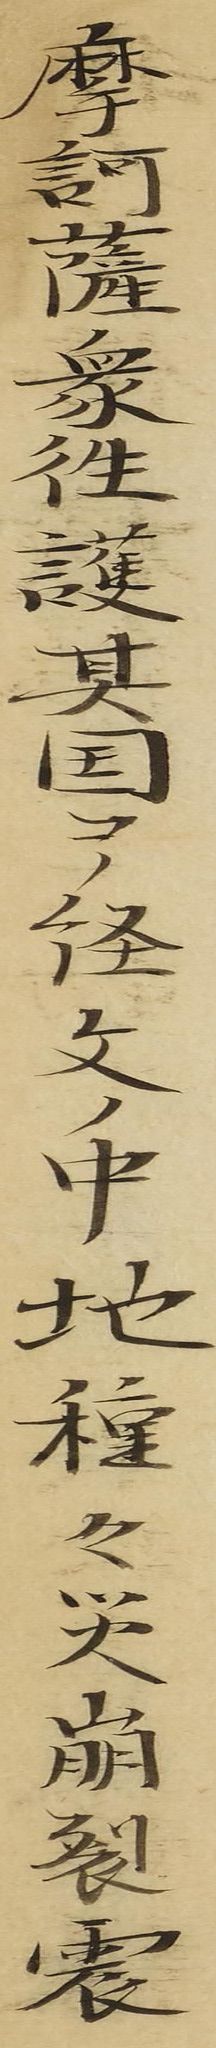摩訶薩衆徃護其国コノ経文ノ中地種々災崩裂震

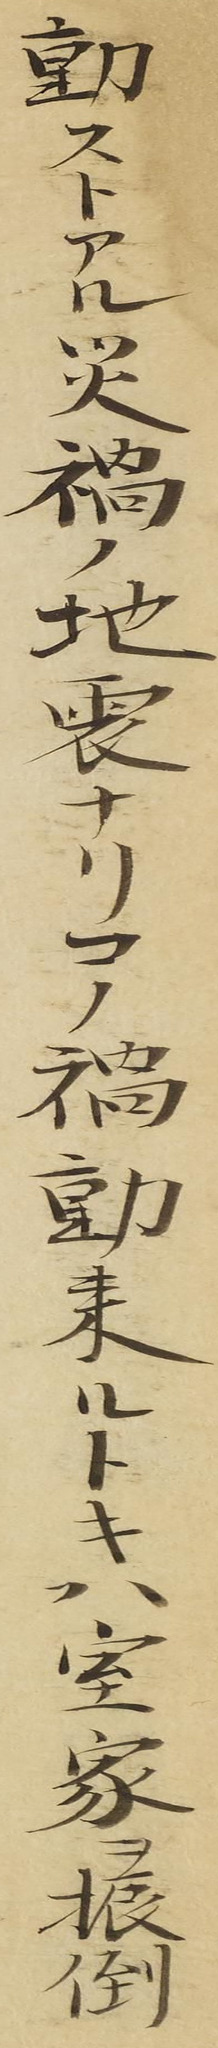動ストアル災禍ノ地震ナリコノ禍動来ルトキハ室家ヲ振倒
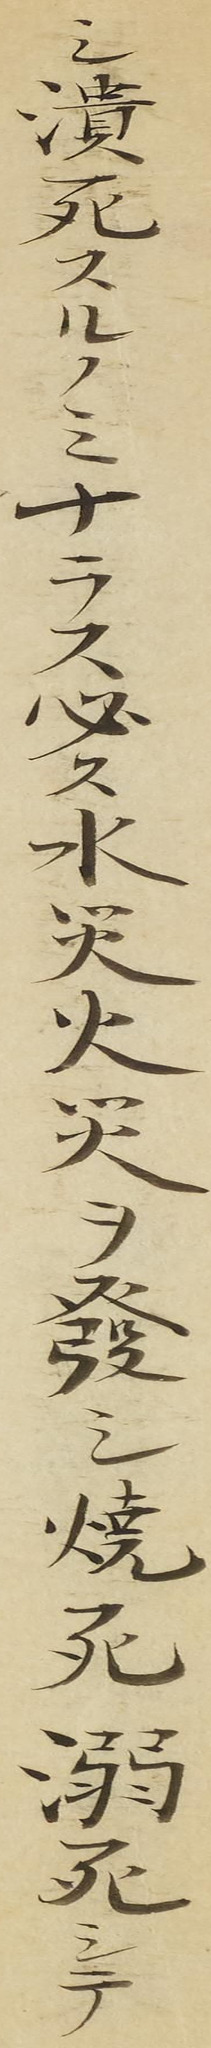シ潰死スルノミナラス必ス水災火災ヲ発シ焼死溺死シテ
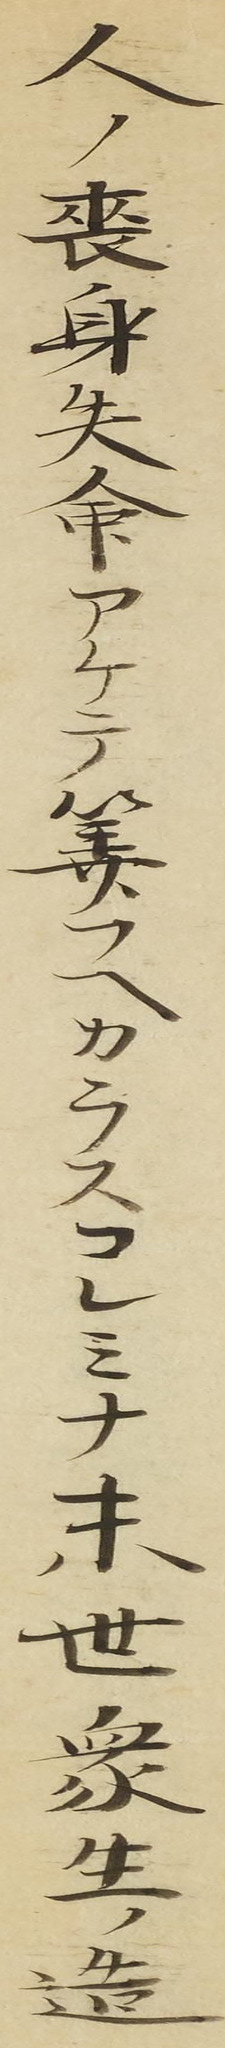人ノ喪身失命アケテ算フヘカラスコレミナ末世衆生ノ造
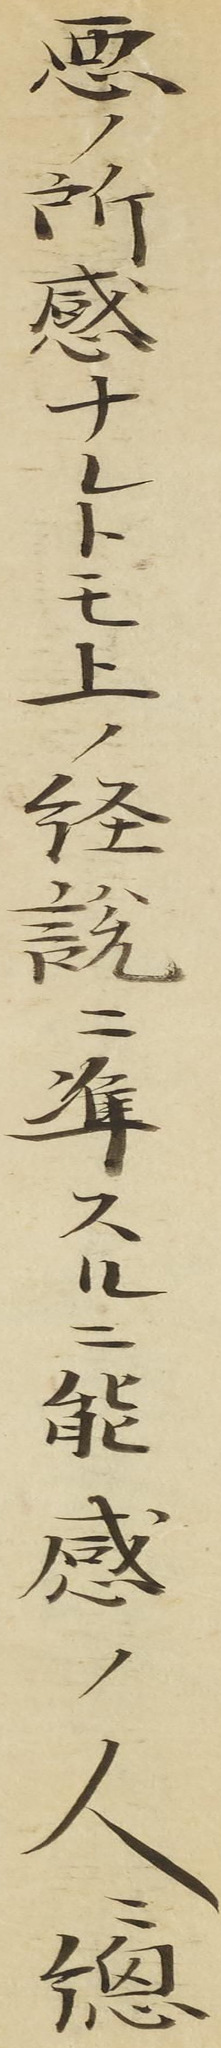悪ノ所感ナレトモ上ノ経説ニ準スルニ能感ノ人ニ総
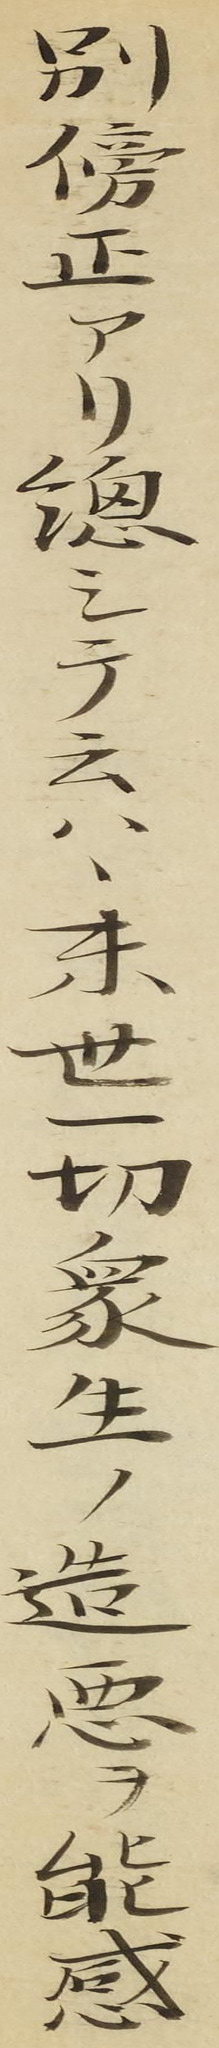別傍正アリ総シテ云ハヽ末世一切衆生ノ造悪ヲ能感
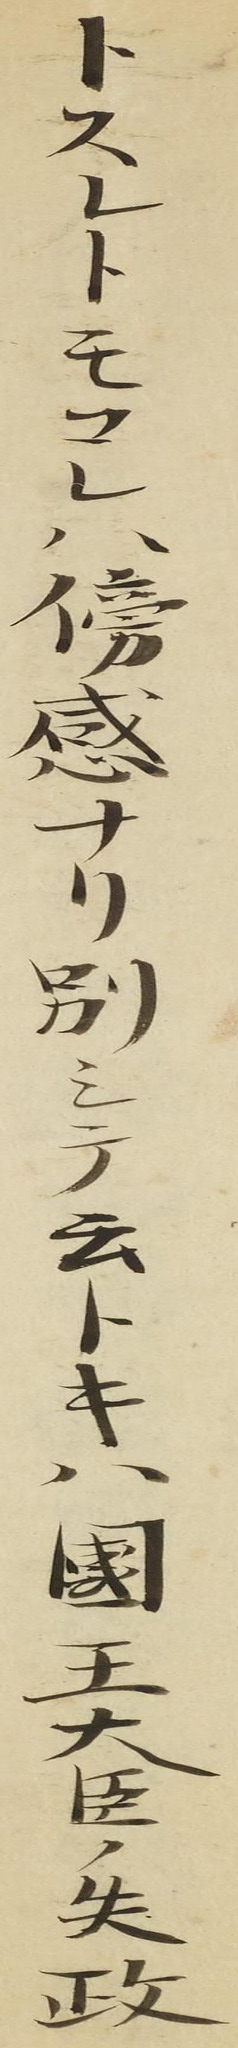トスレトモコレハ傍感ナリ別シテ云トキハ国王大臣ノ失政
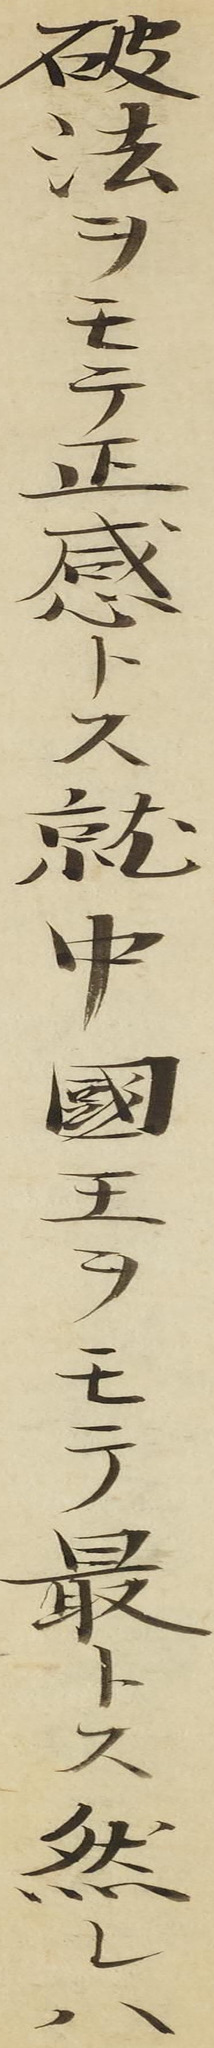破法ヲモテ正感トス就中国王ヲモテ最トス然レハ
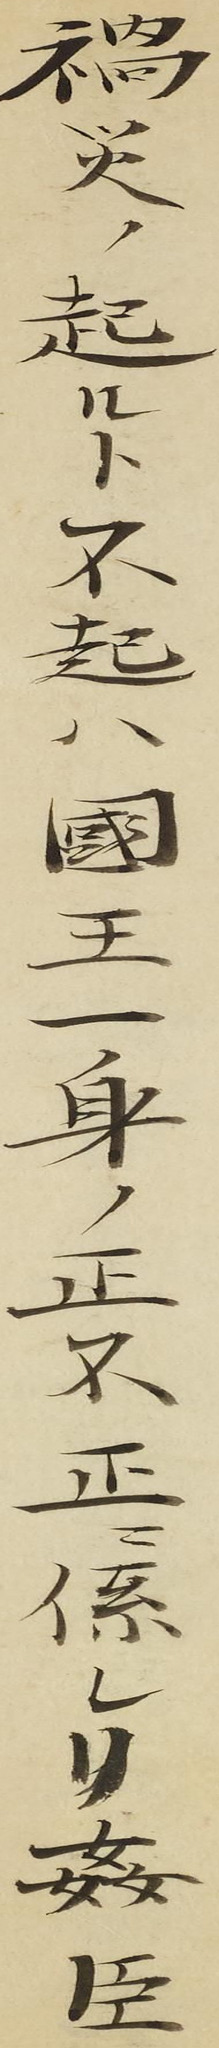禍災ノ起ルト不起ハ国王一身ノ正不正ニ係レリ姦臣
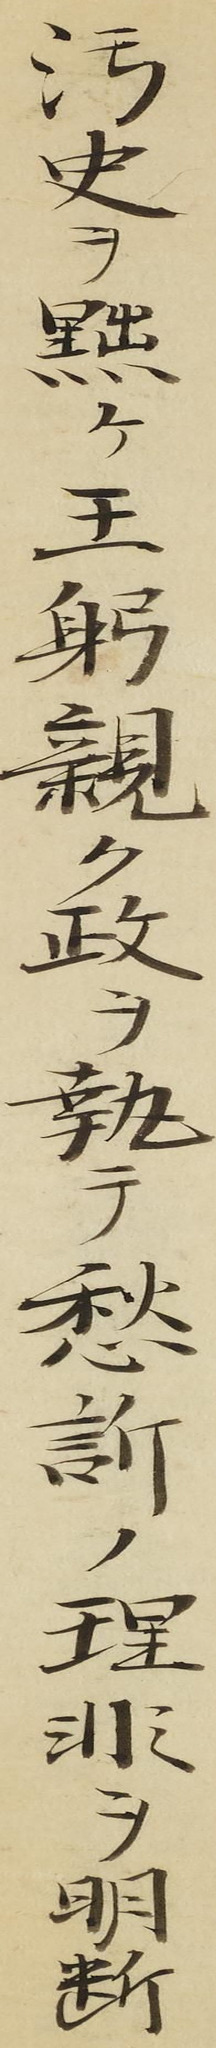汚史ヲ点ケ王躬親ク政ヲ執テ愁訴ノ理非ヲ明断
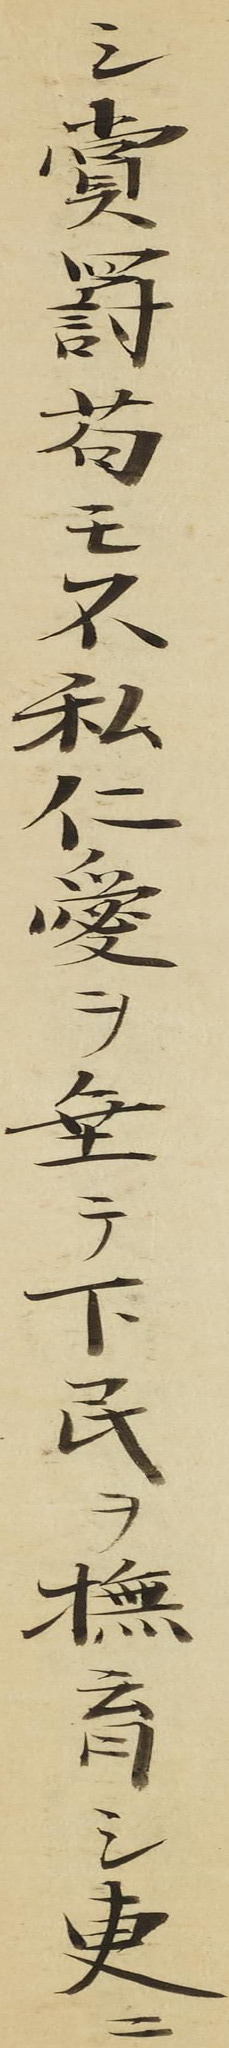シ賞罰苟モ不私仁愛ヲ垂テ下民ヲ撫育シ更ニ
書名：地震説　鶴高山善仁寺天柗老人著述　全
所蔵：東京大学地震研究所図書室 Earthquake Research Institute Library, The University of Tokyo, JAPAN
